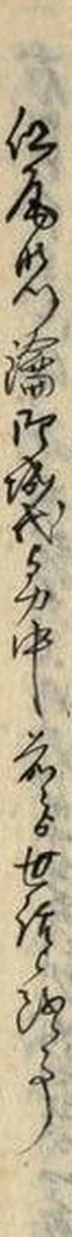但瓦御門鑰御城代与力中前々ゟ世話被致候事

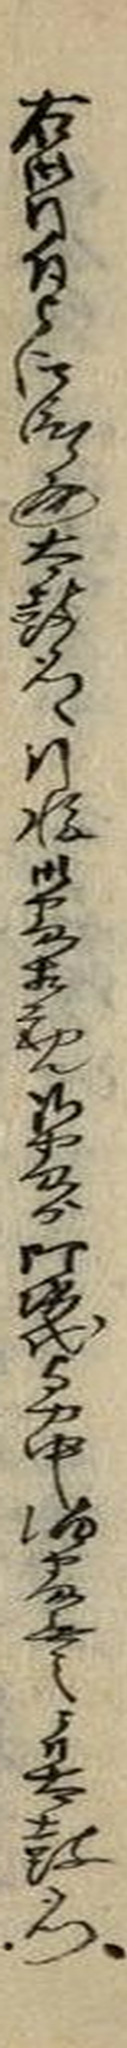右御目付被仰渡候通太鼓御門へ引移御番相勤候御番ゟ御城代与力中泊無之ニ付太鼓御門
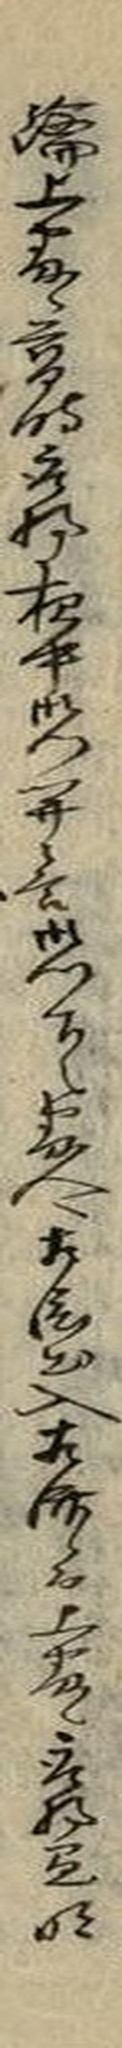鑰上番へ暮時取揚夜中御門開候節御門下之番人へ相渡出入相済候而上番へ取揚置明
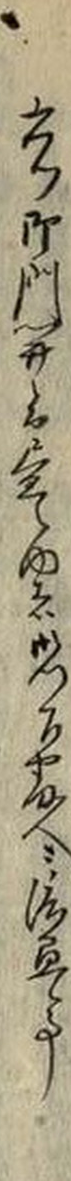六ツ御門開候而昼之内者御門下番人ニ渡置候事
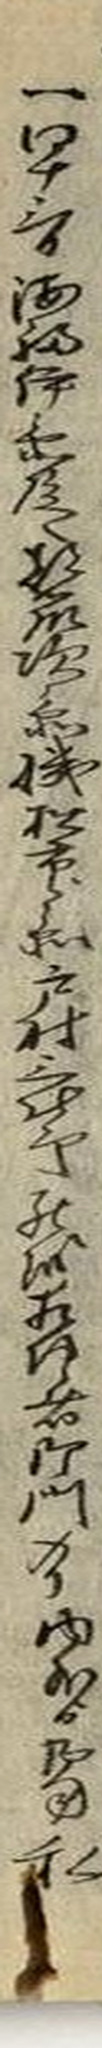一同十三日海福伊兵衛殿へ都築次兵衛磯松市郎兵衛戸村三次郎罷越相伺候は御門〆り内外ゟ御用私
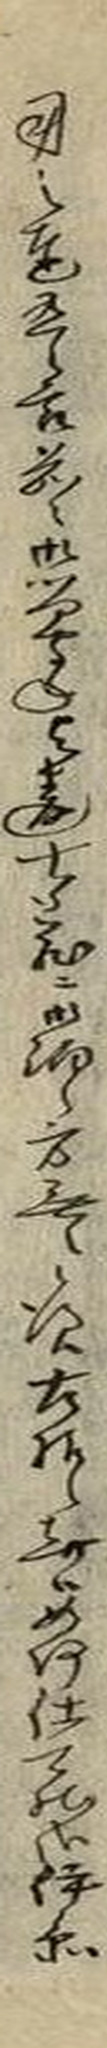用之達有之節前々御留守年と違七ツ蔵ニ御泊候方無之候得ハ左様之刻ハ如何仕可然哉伊兵衛
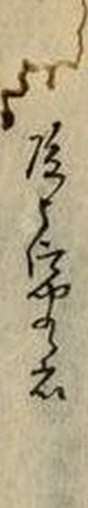殿被仰聞候は
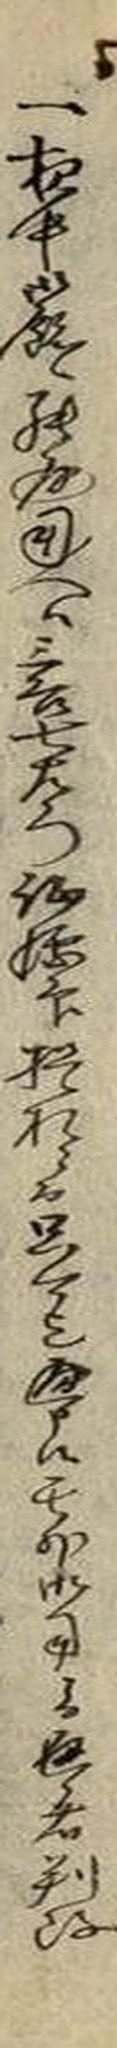一夜中御厩へ罷通用人ハ三谷七左衛門証拠印提札ニ而只今迄通申候其外御用ニ而通候者判改
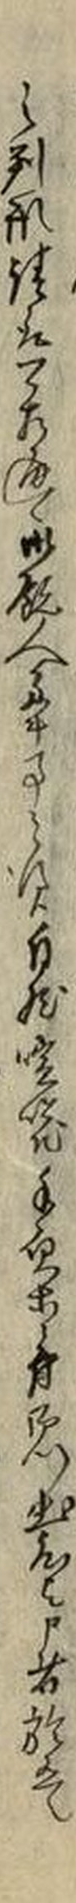之判形請取可相通候御厩人多キ事ニ候得ハ自然喧嘩手負等ニ付御門出度と申者於有之
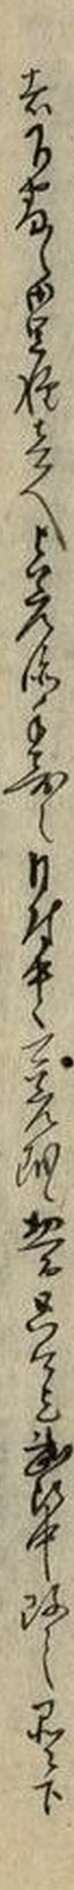は下番之御足軽壱人被差添手寄之目付中へ可差越候惣而只今迄武頭中改之品々下
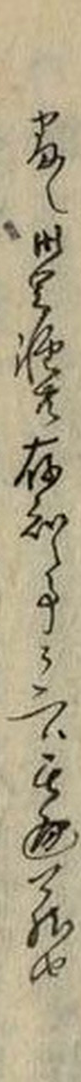番之御足軽共存知候事ニ候得ハ其通可然候
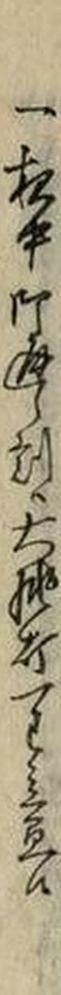一夜中御通候刻ハ右挑灯可被立置候
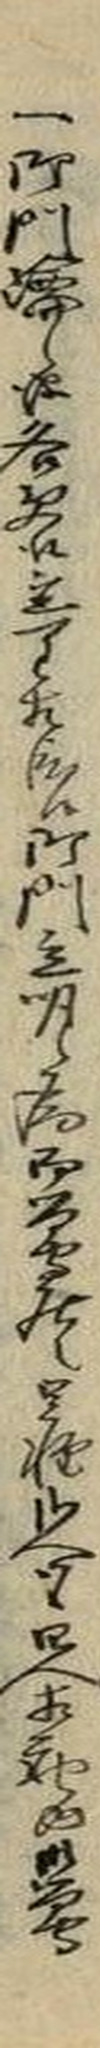一御門鑰之儀各受取置可被相渡候御門立明為時御留守居之足軽弐人ツゝ四人相勤候内御留守
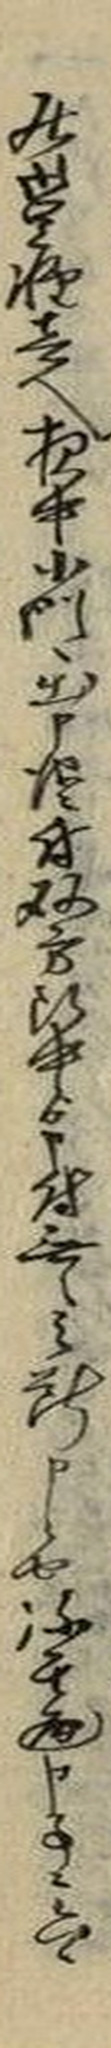居御足軽壱人夜中小門へ出申儀ニ付双方頭中ゟ申付無之断申候由致其通申事ニ候ハヽ
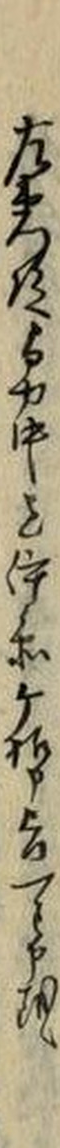左衛門殿与力中迄伊兵衛ヶ様申旨可被申越候
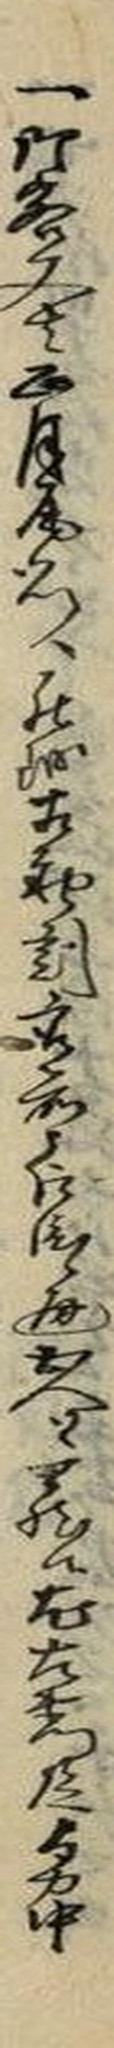一御暮又は正月瓦御門へ罷越相勤候刻最前被仰渡候通五人ツヽ可然候候尤左衛門殿与力中
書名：御門御櫓之部
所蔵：福井県文書館 Fukui Prefectural Archives
